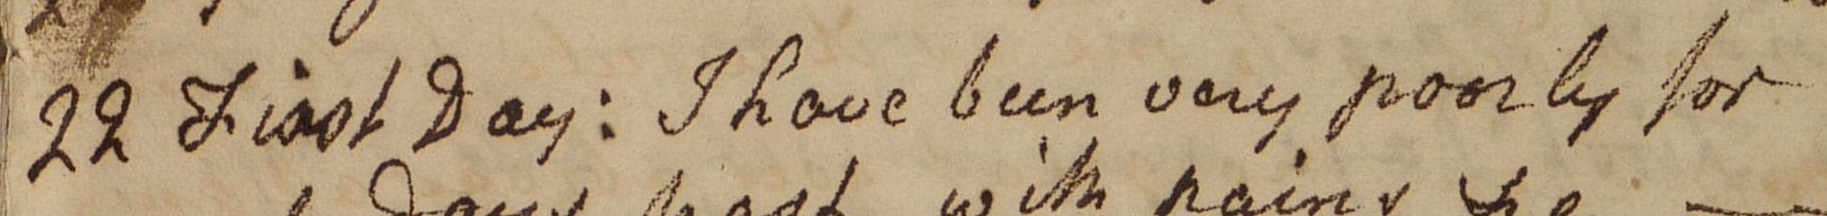22 First Day: I have been very poorly for
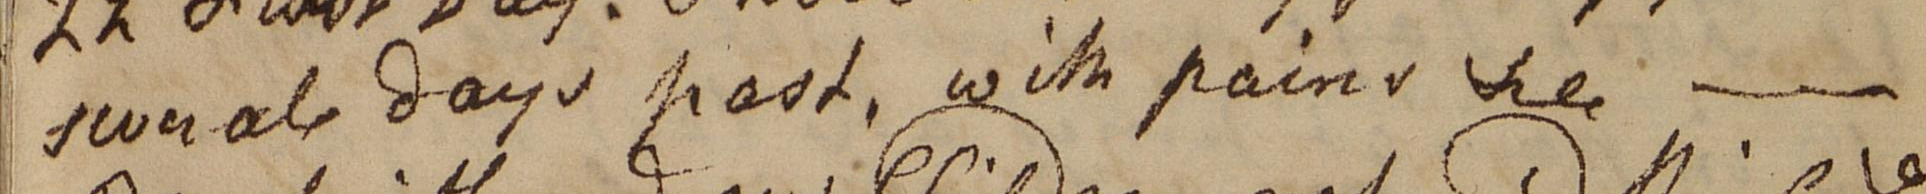several days past, with pains &c-
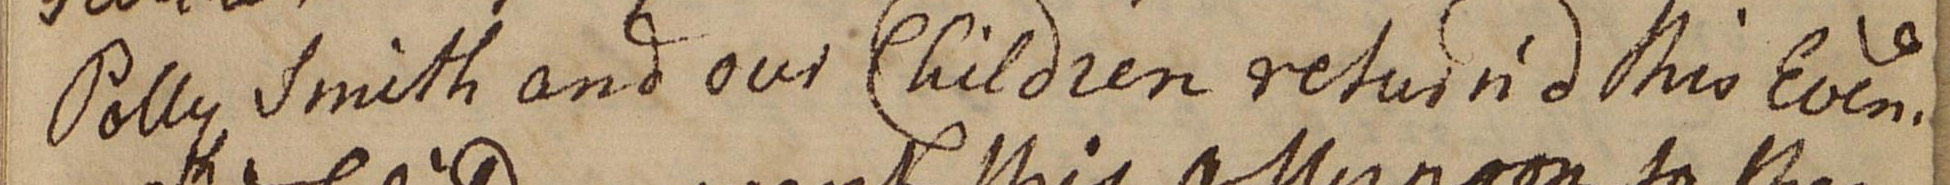Pally Smith and our Children return'd this Even^g.
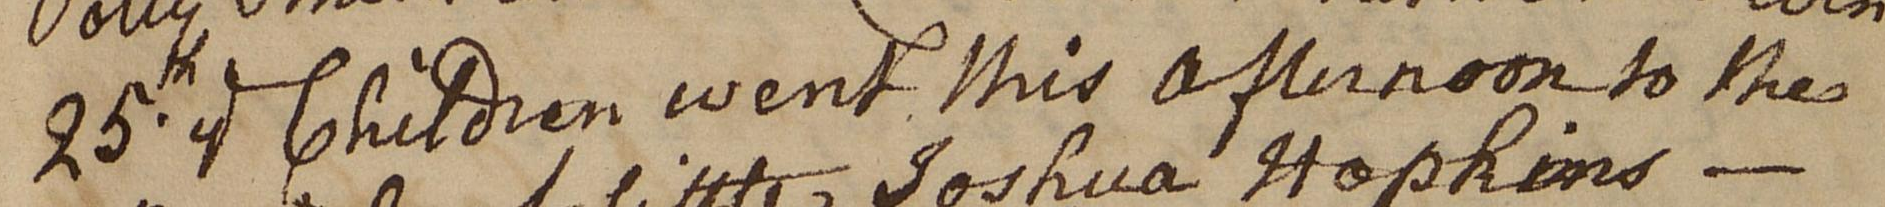25^th y^e Children went this Afternoon to the
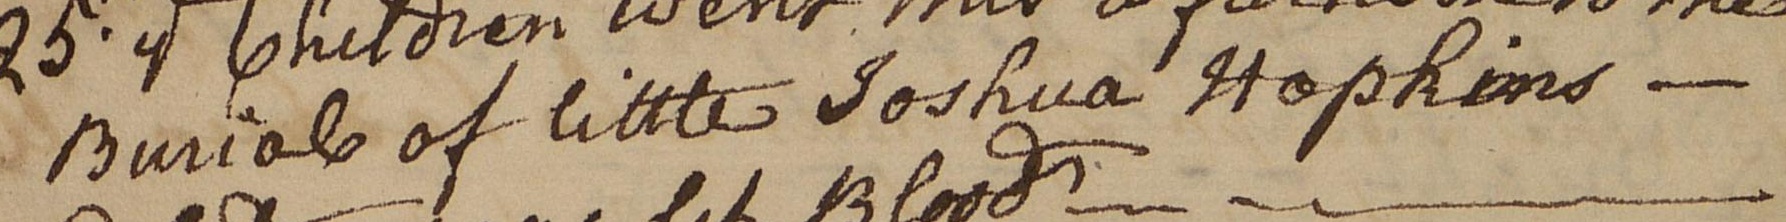Burial of little Joshua Hopkins-
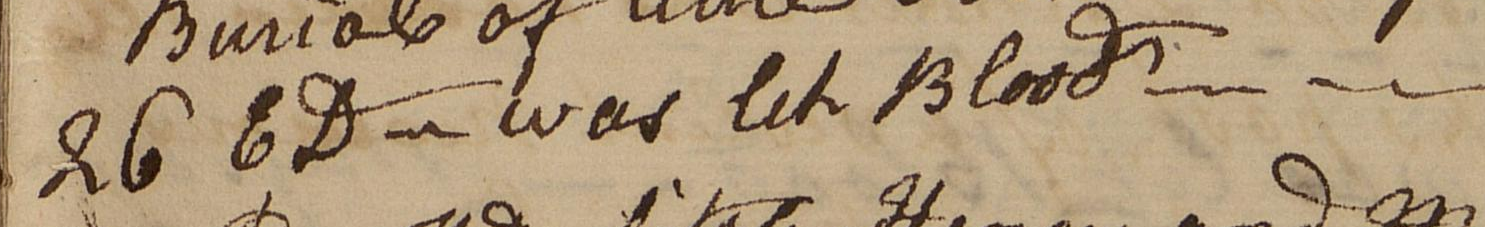26 ED- was let Blood--
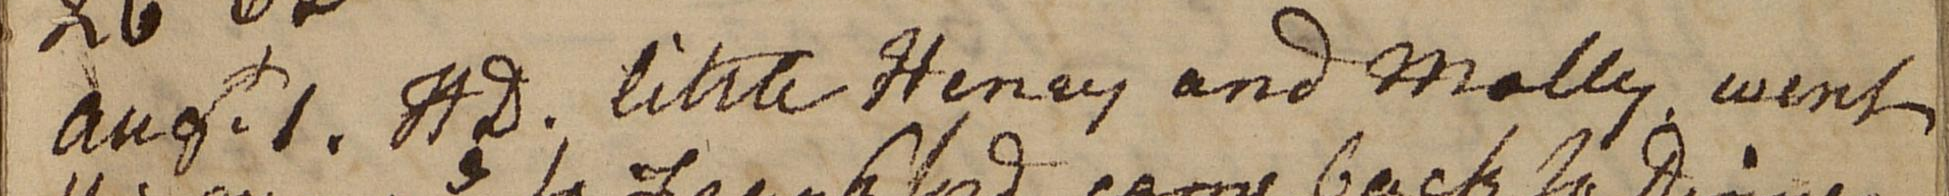Aug^t. 1. HD. little Henry and Molly, went
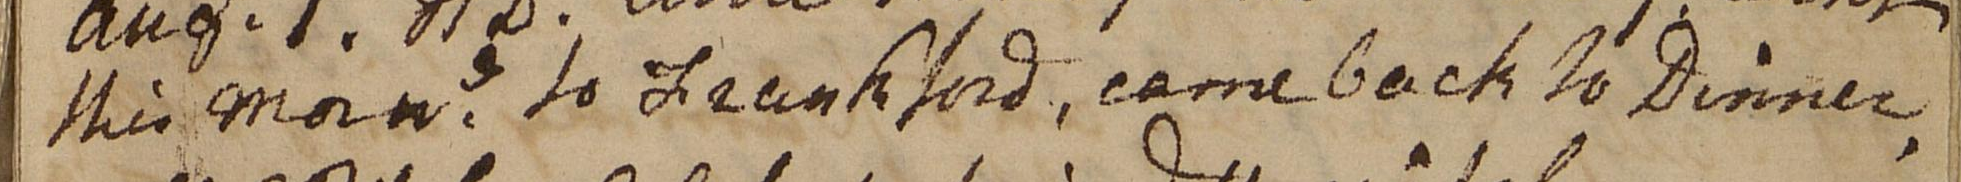this morn^g. To Frankford, came back to Dinner,
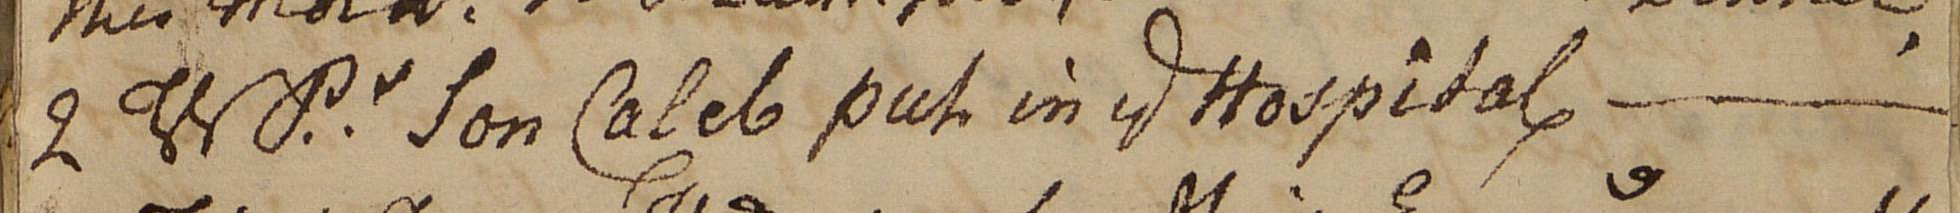2 W P^s. Son Caleb put in y^e Hospital-
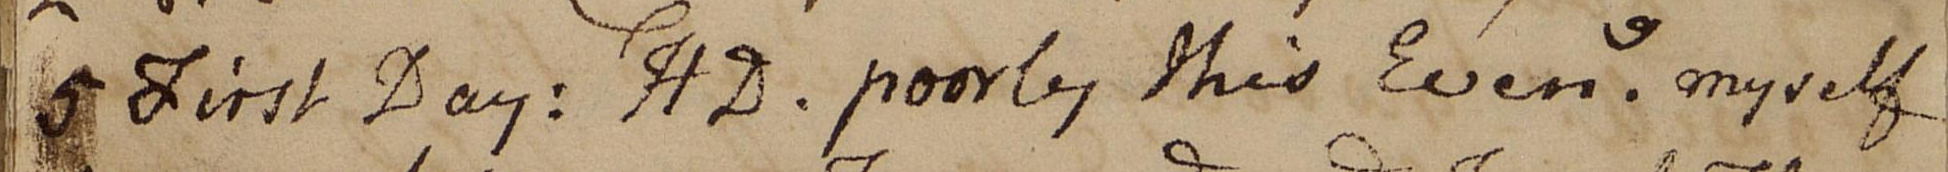5 First Day: HD poorly this Even^g. myself
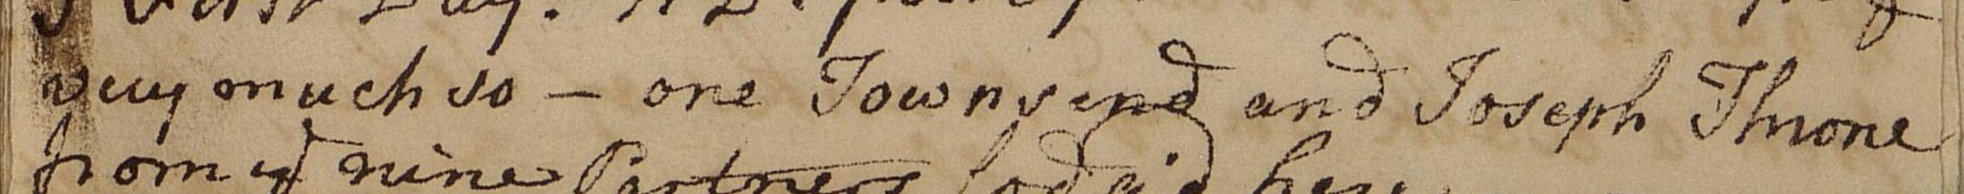very much so- one Townsend and Joseph Throne
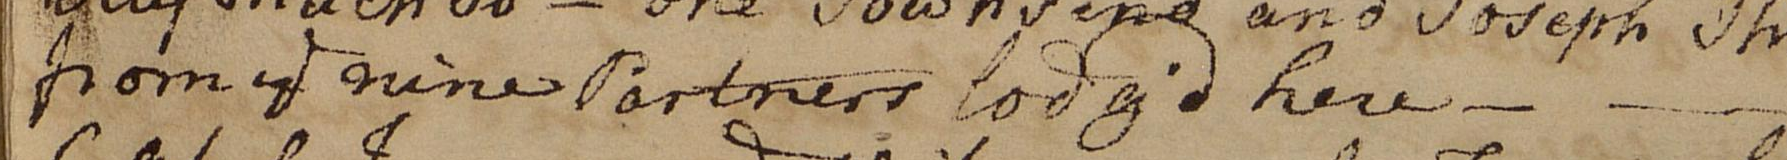from y^e nine Partners lodg'd here--
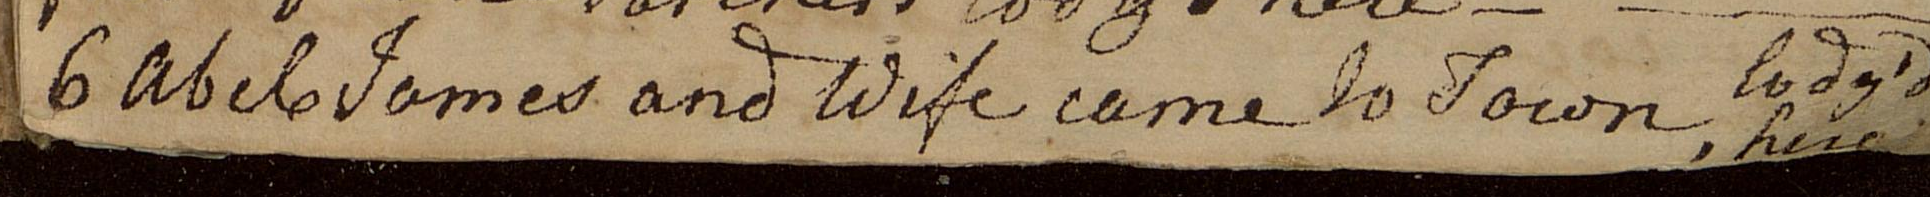6 Abel James and Wife came to Town, ^lodg'd here
